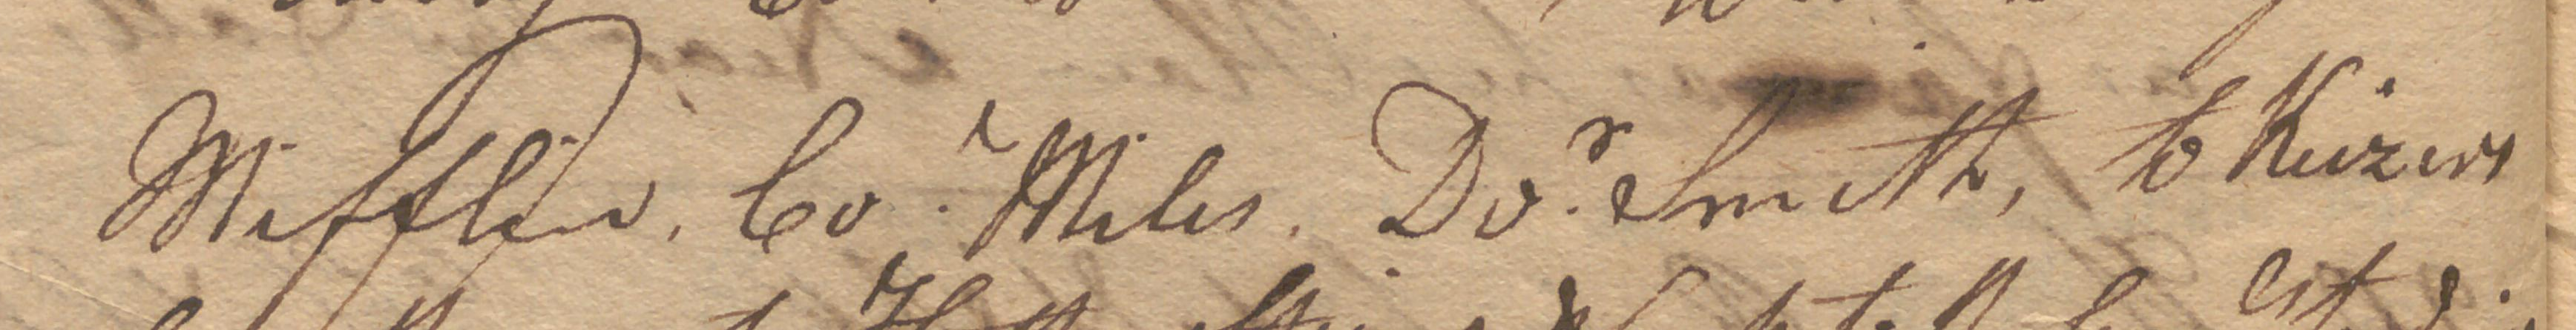Mifflin, Co^l. Miles, Do^r. Smith, to Kuzirs
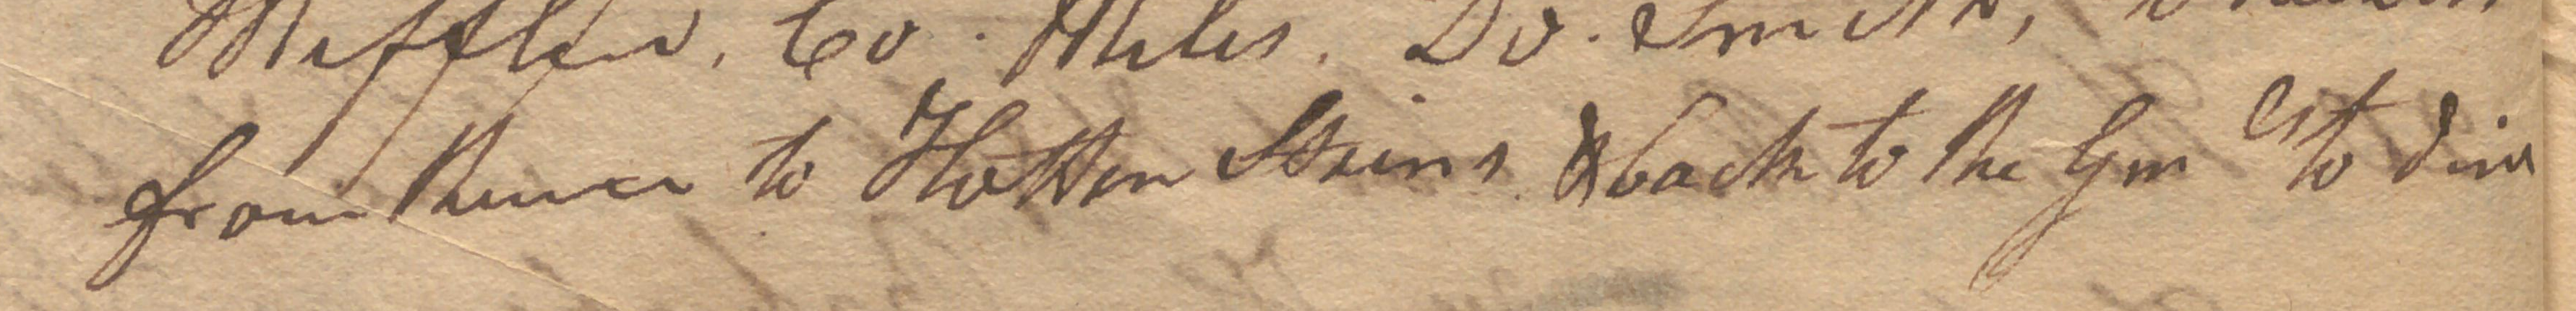from thence to Hothen Stines & back to the Gen^l to dine
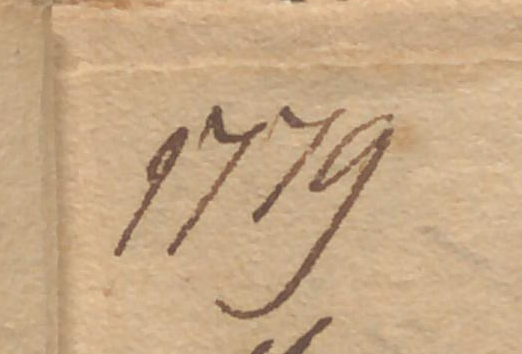1779
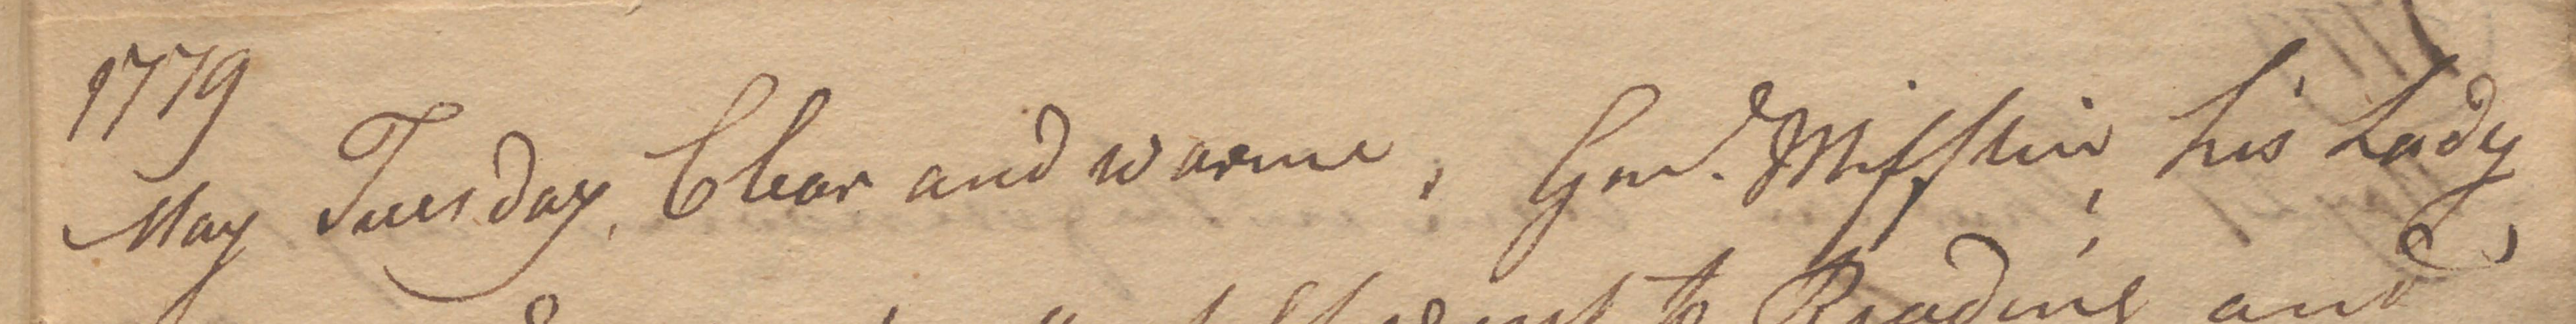May Tuesday, Clear and warme, Gen^l. Mifflin his Lady
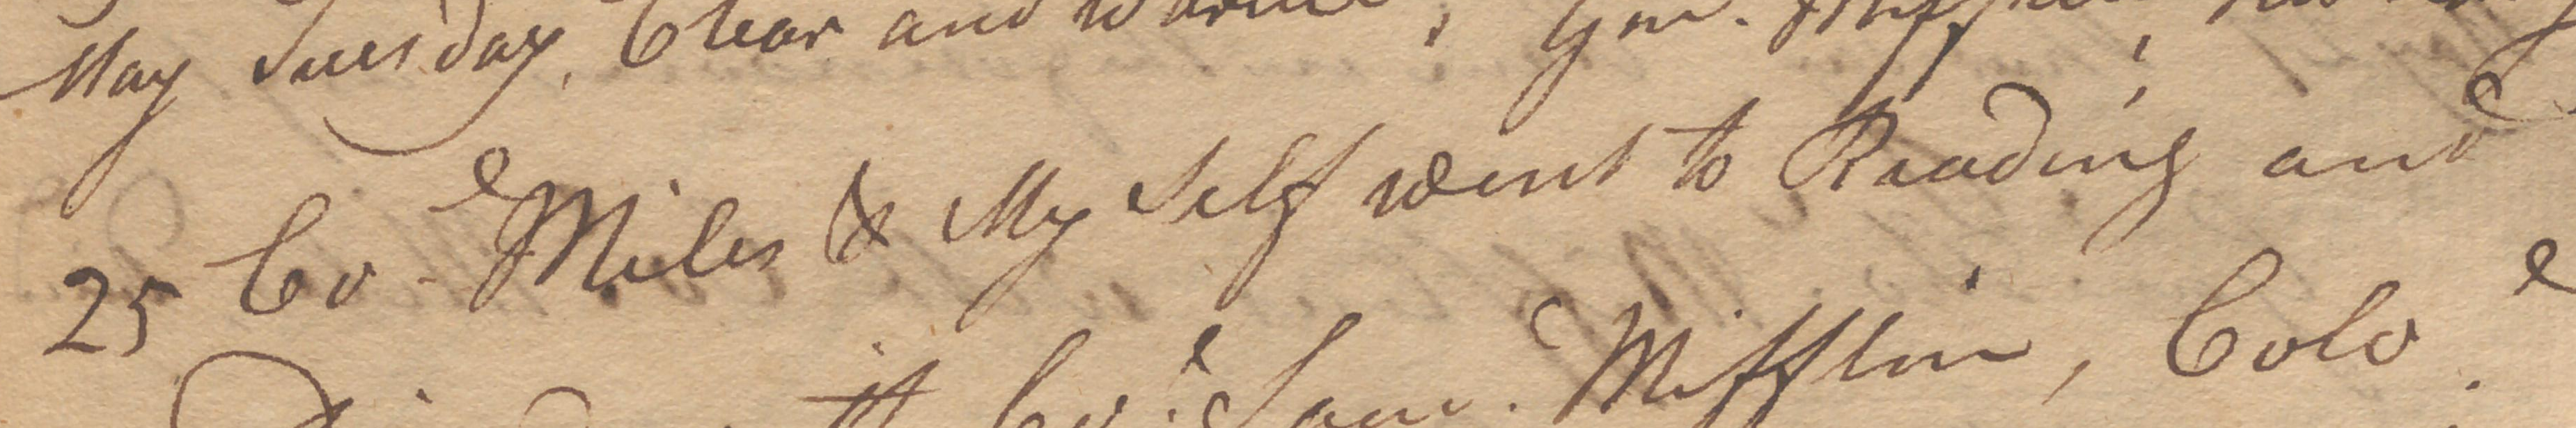25 Co^l. Miles & My self went to Reading and
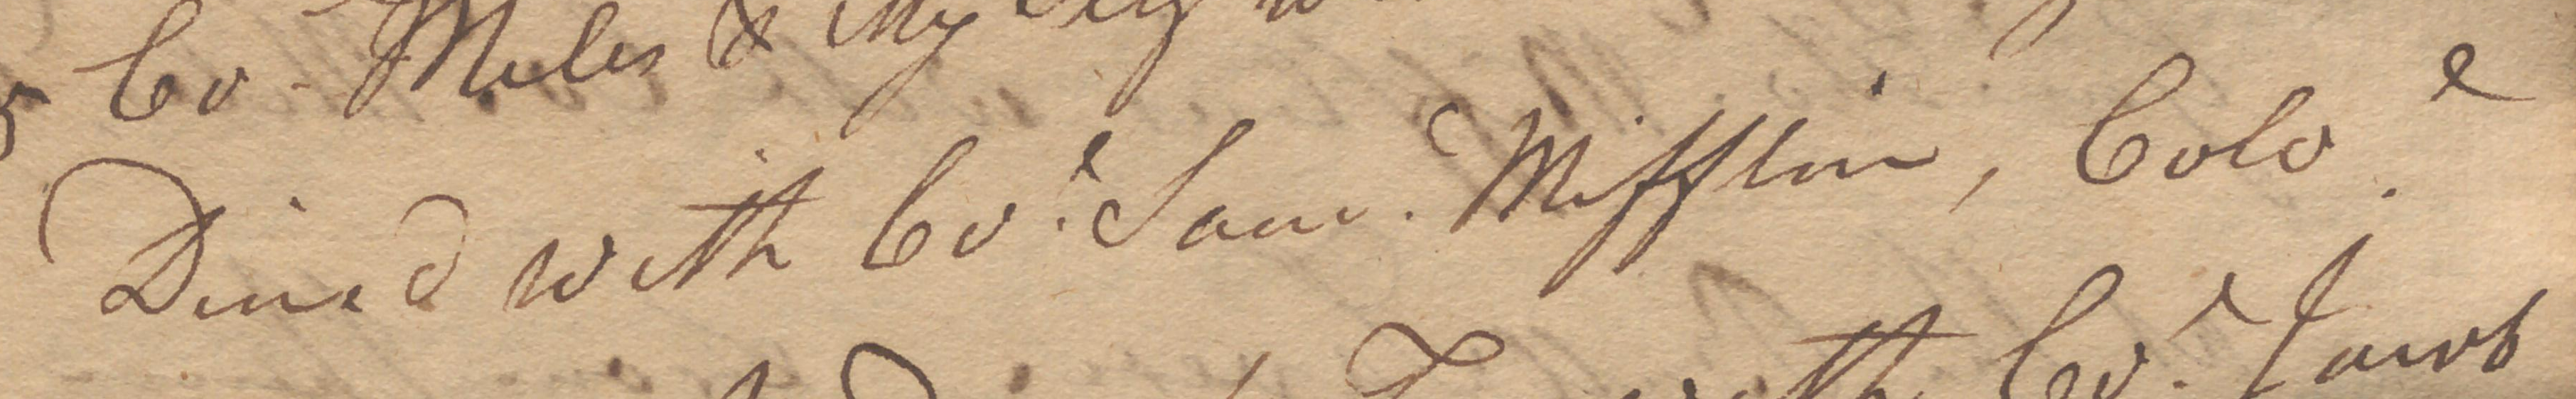Dined with Co^l. Sam^l. Mifflin, Colo^l
